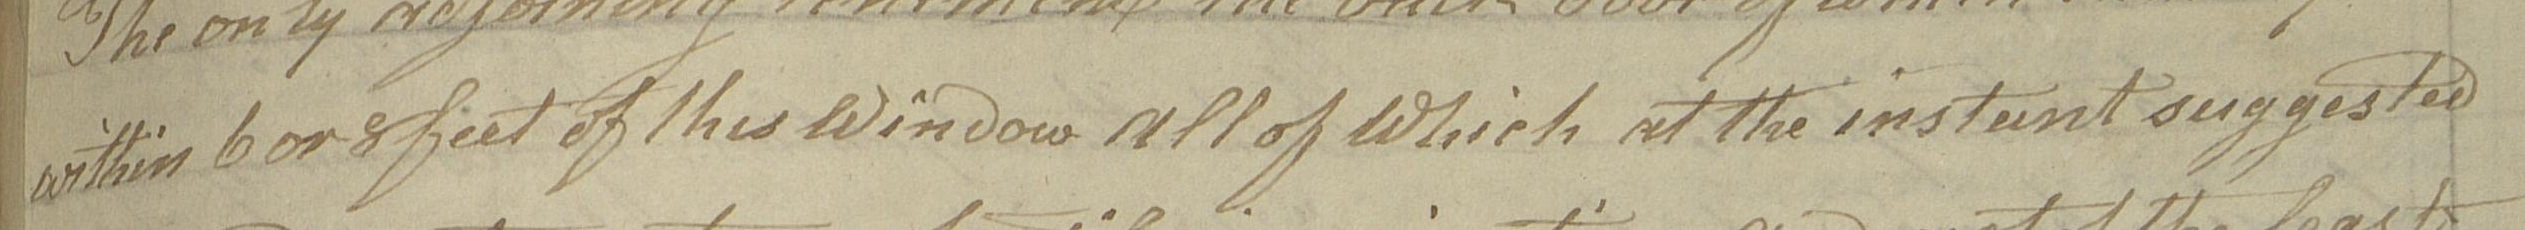within 6 or 8 feet of this Window All of Which at the instant suggested
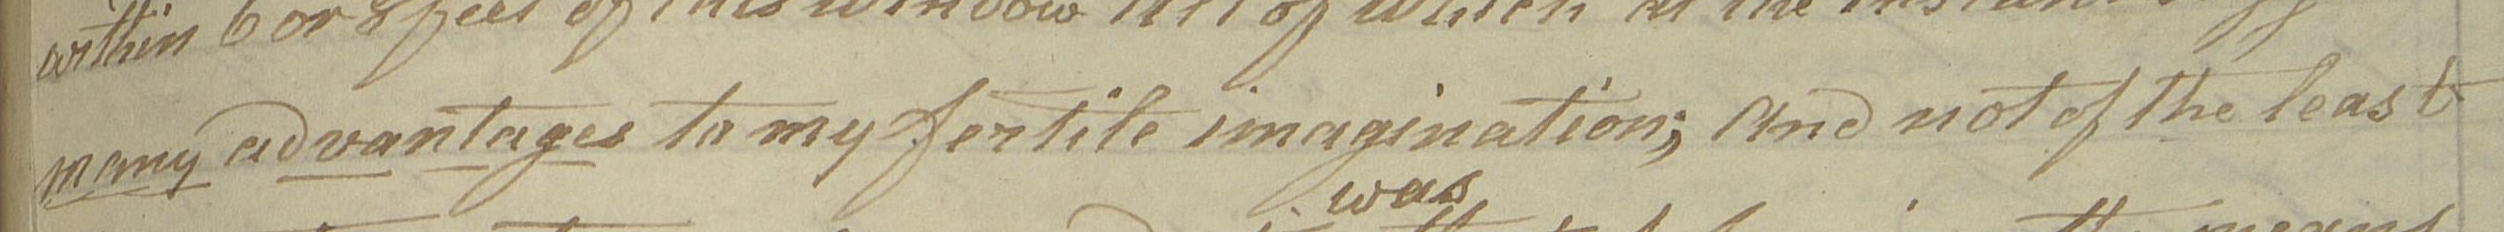many advantages to my fertile imagination; and not of the least
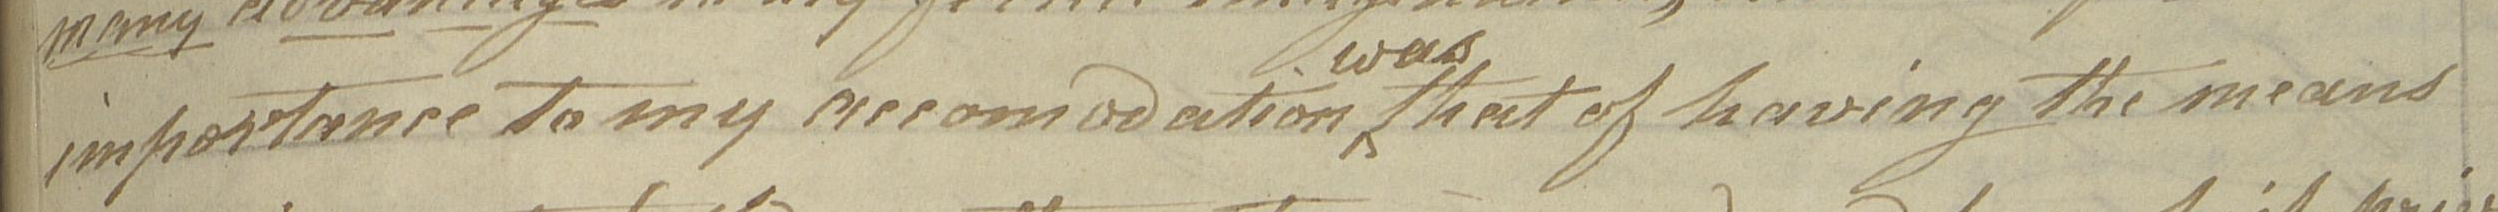importance to my accomodation ^ that of having the means
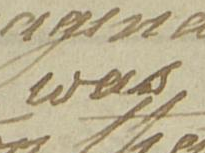was
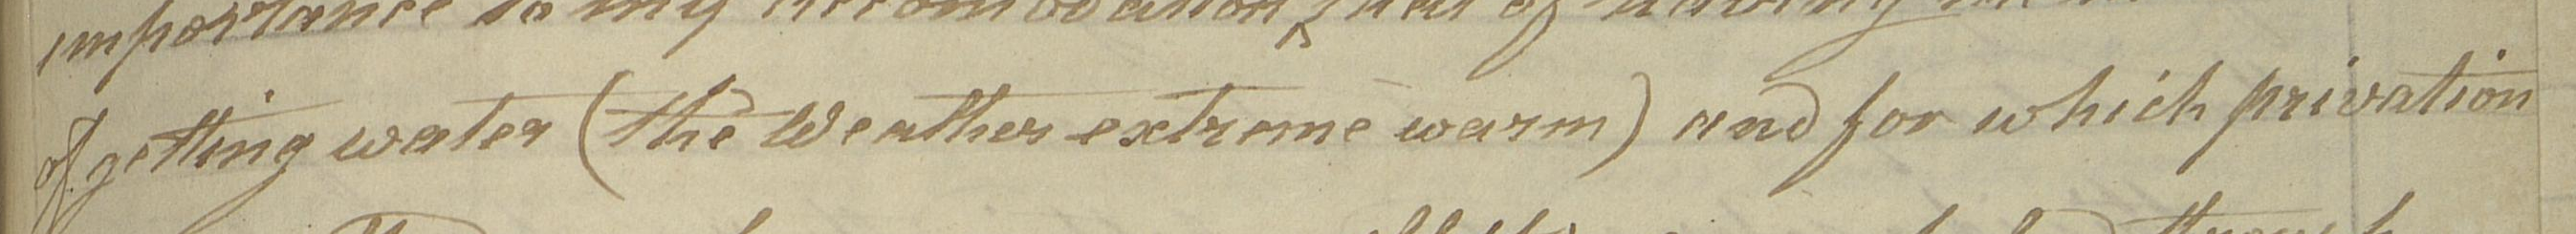of getting water (the Weather extreme warm) and for which privation
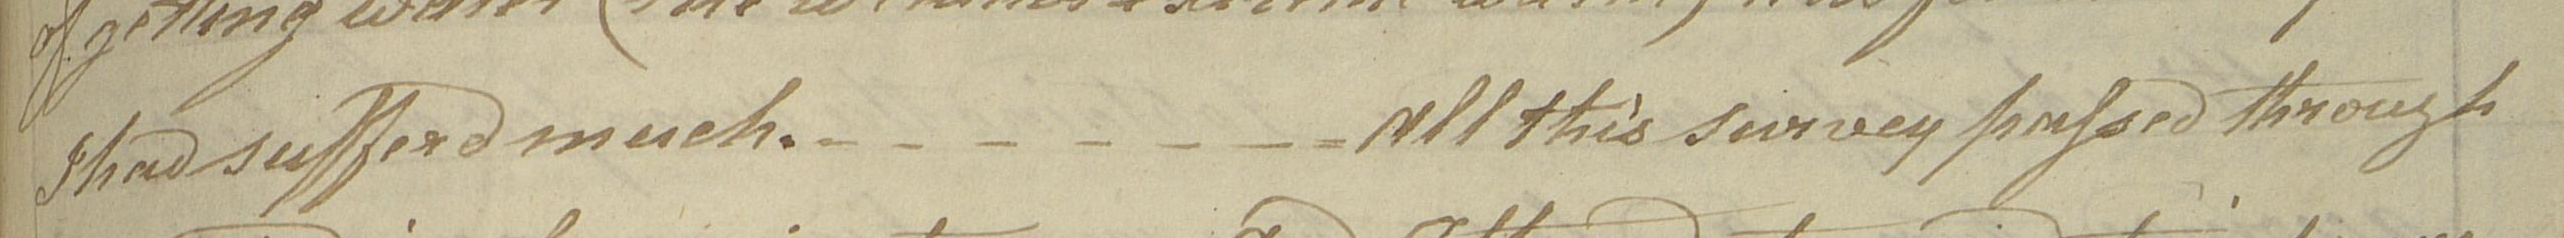I had sufferd much. All this survey passed through
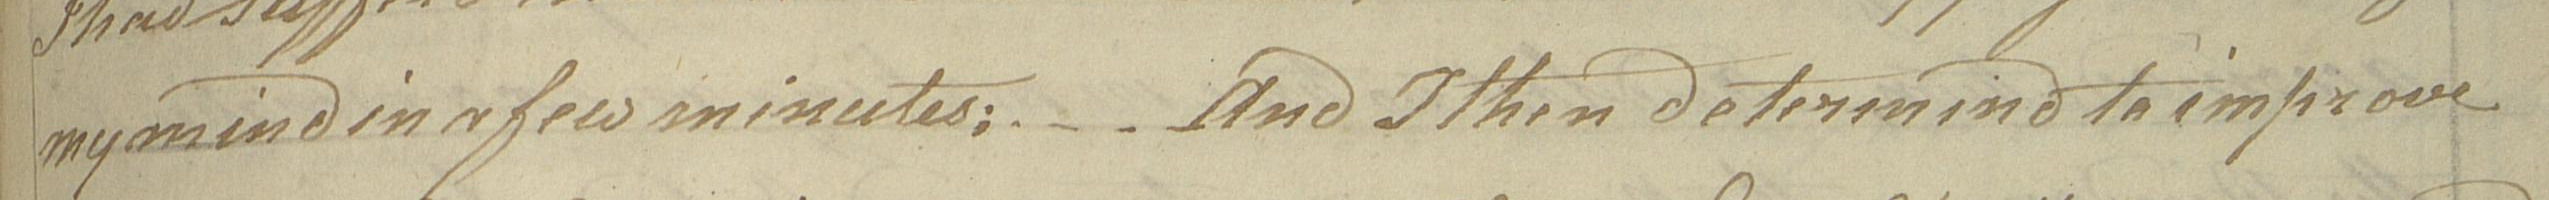my mind in a few minutes; And I then determind to improve
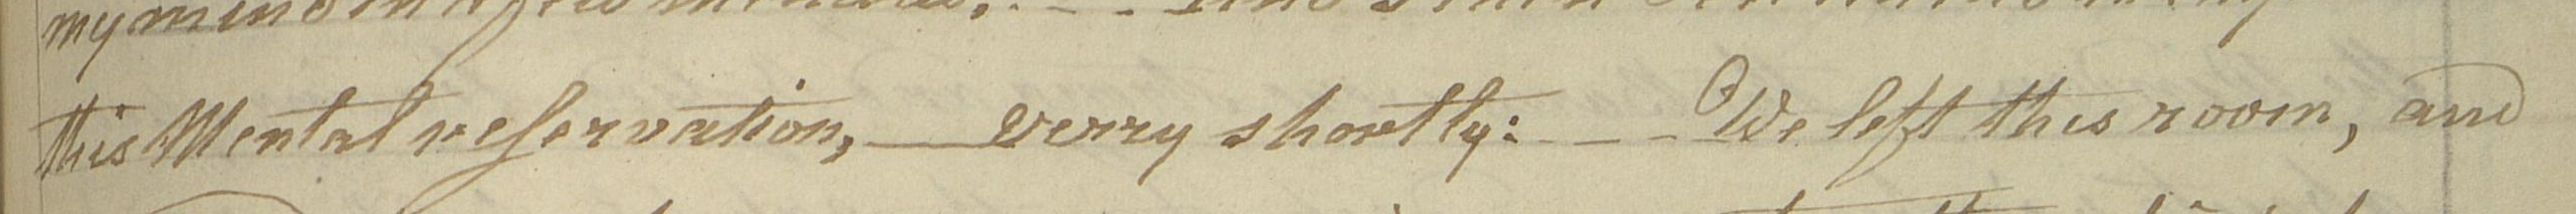this Mental reservation, verry shortly: We left this room, and
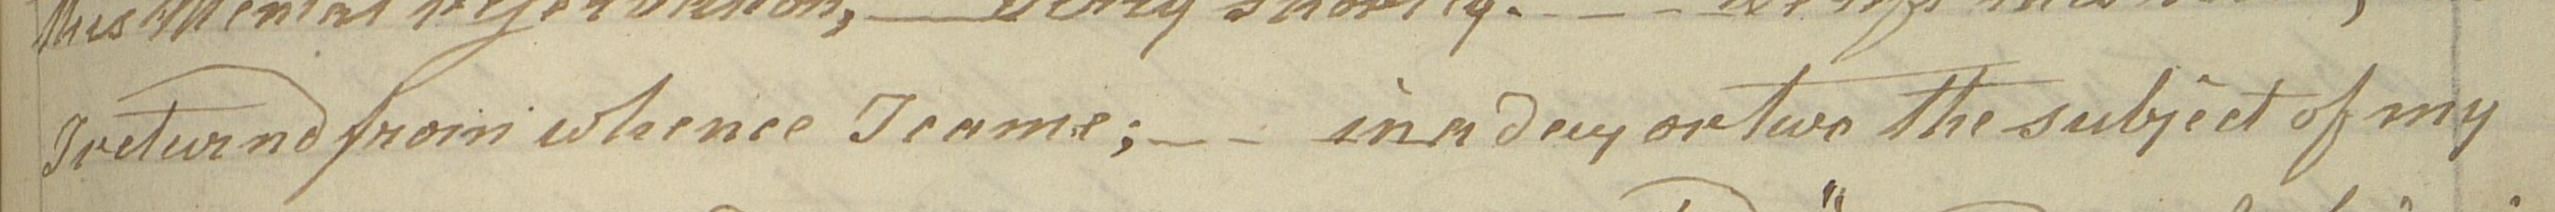I returnd from whence I came; in a day or two the subject of my
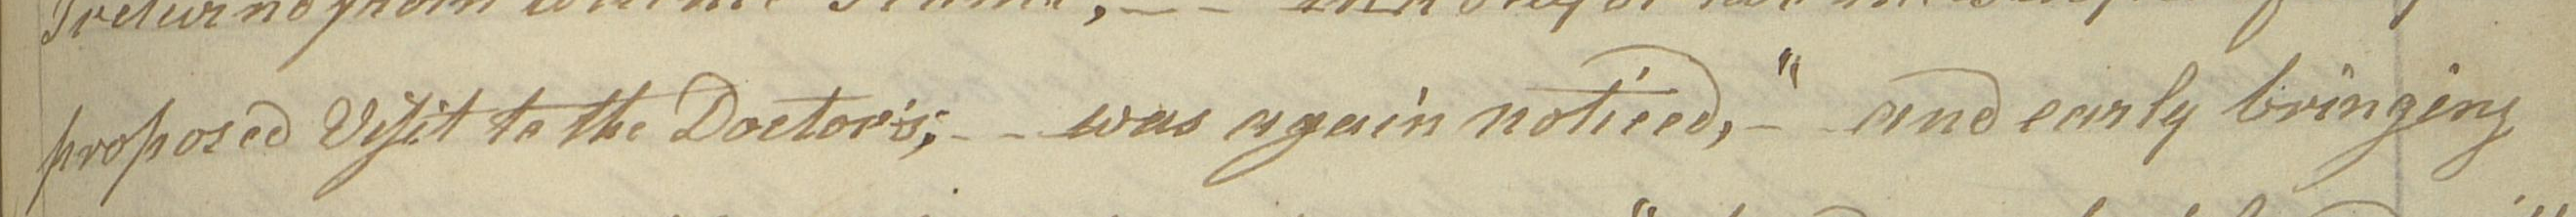proposed Visit to the Doctors; was again noticed, "and early bringing
